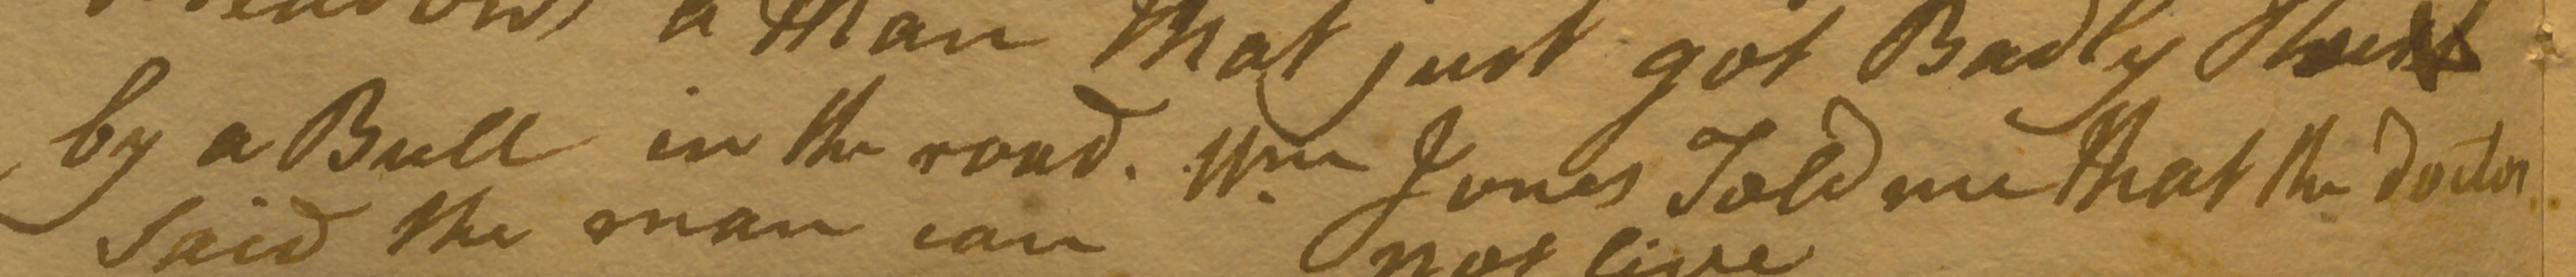by a Bull in the road. W^m. Jones Told me that the doctor
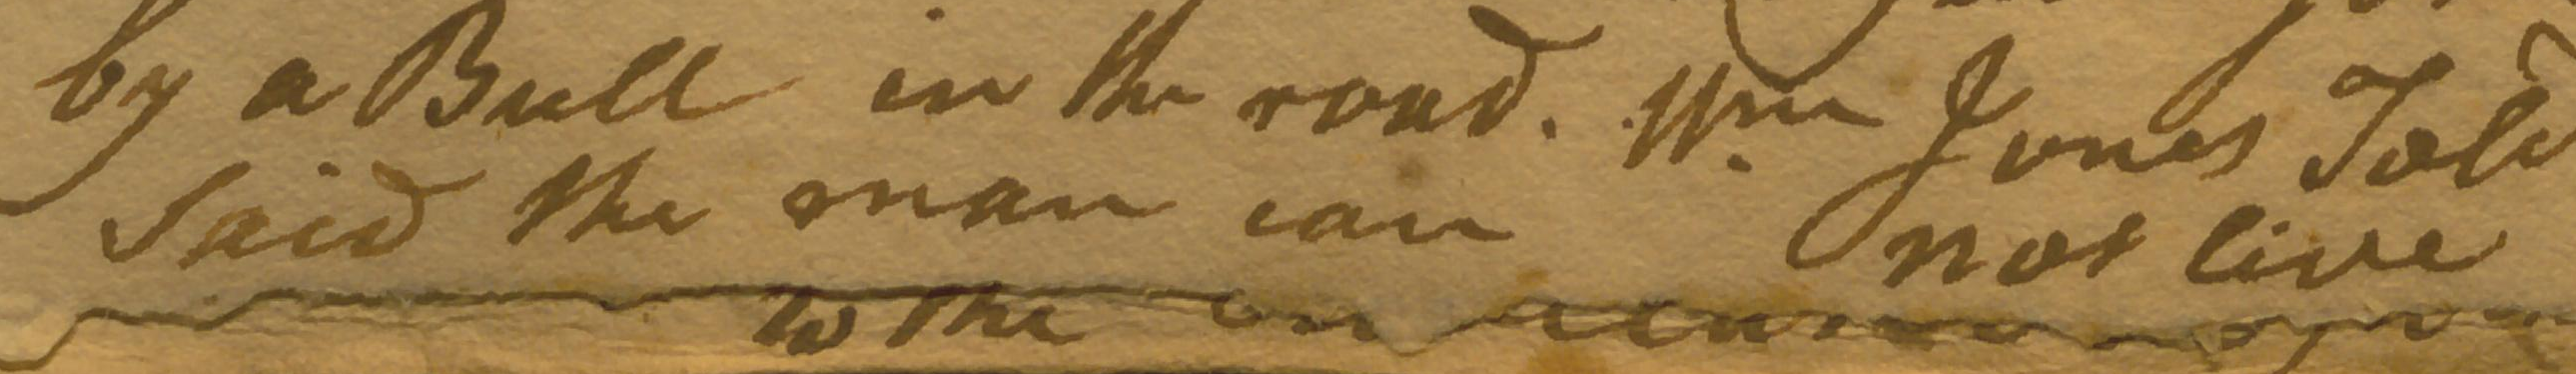said the man can not live
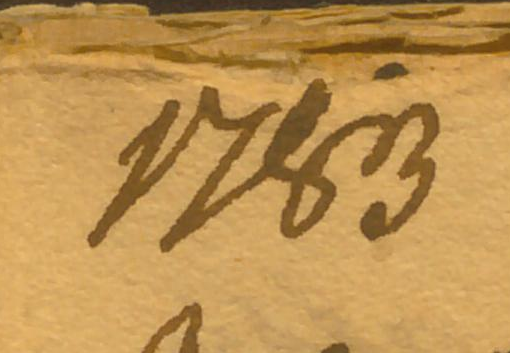1783
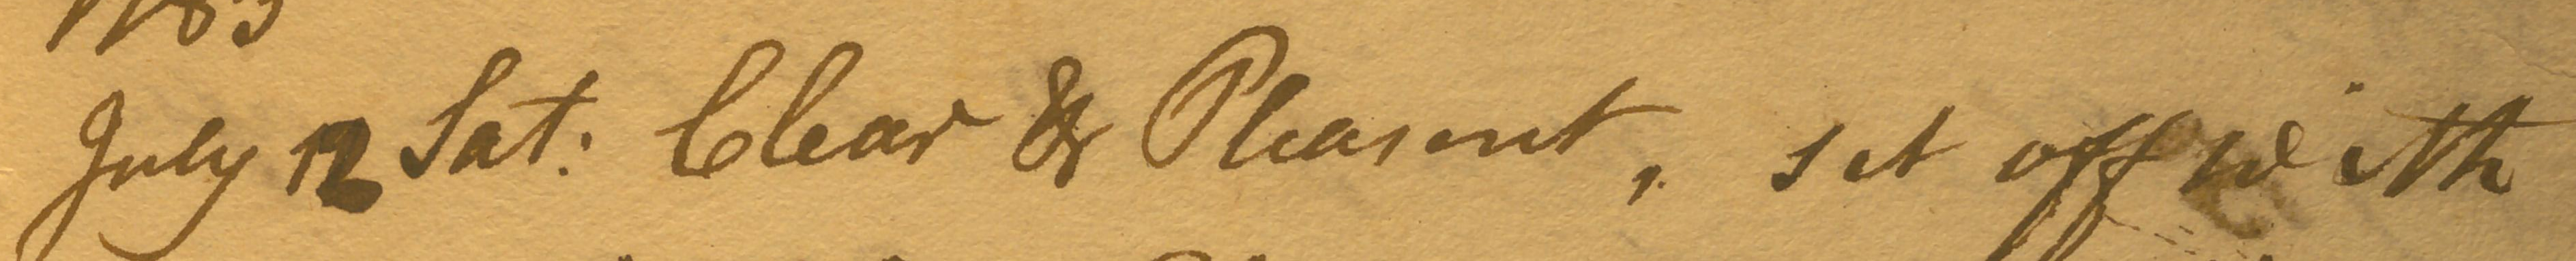July 12 Sat: Clear & Pleasent, set off with
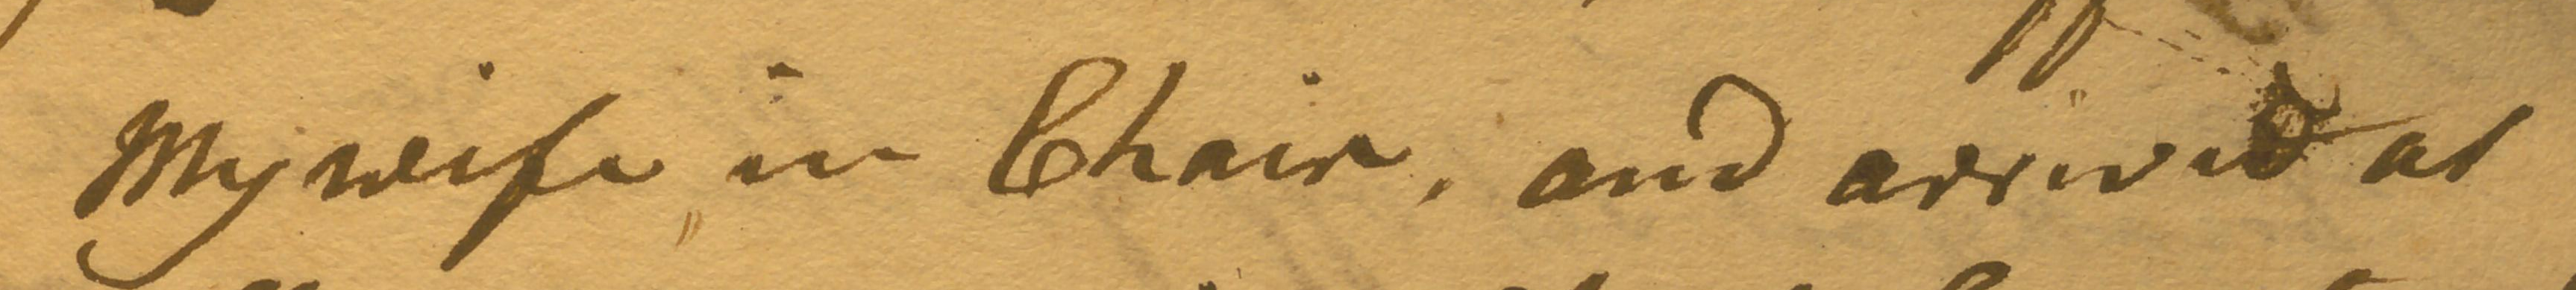My wife in Chair, and arrived at
